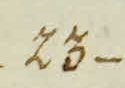23
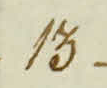13
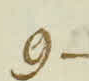9
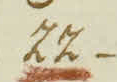22
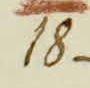18
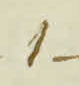1
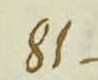81
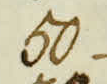50
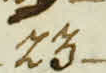23
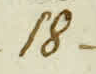18
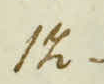12
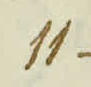11
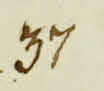37
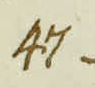47
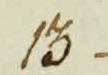13
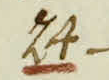24
